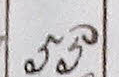55
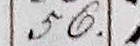56.
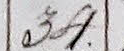34.
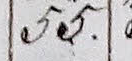55.
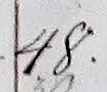48
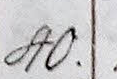40.
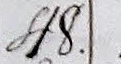48.
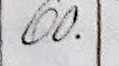60.
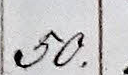50.
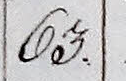63.
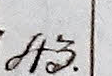43.
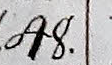48.
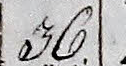36.
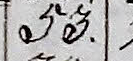53.
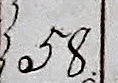58
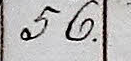56.
